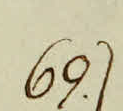69.
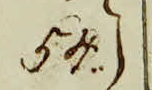54.
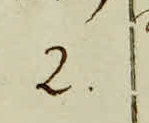2.
